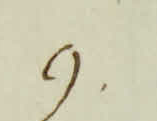9.
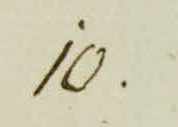10.
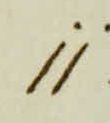11
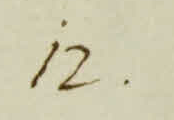12.
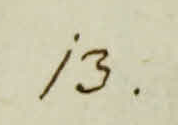13.
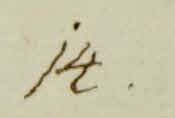14.
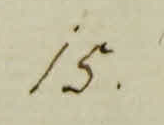15.
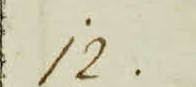12.
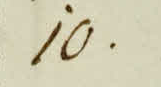10.
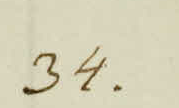34.
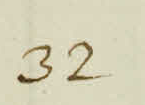32
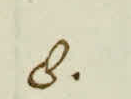8.
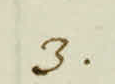3.
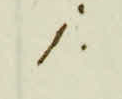1.
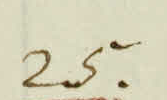25.
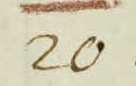20
